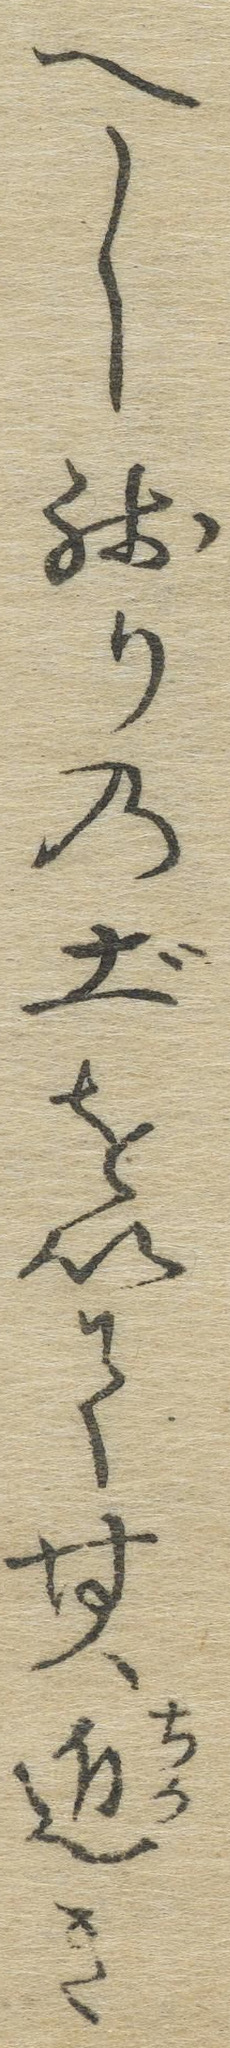へし残りの土を以て其近き
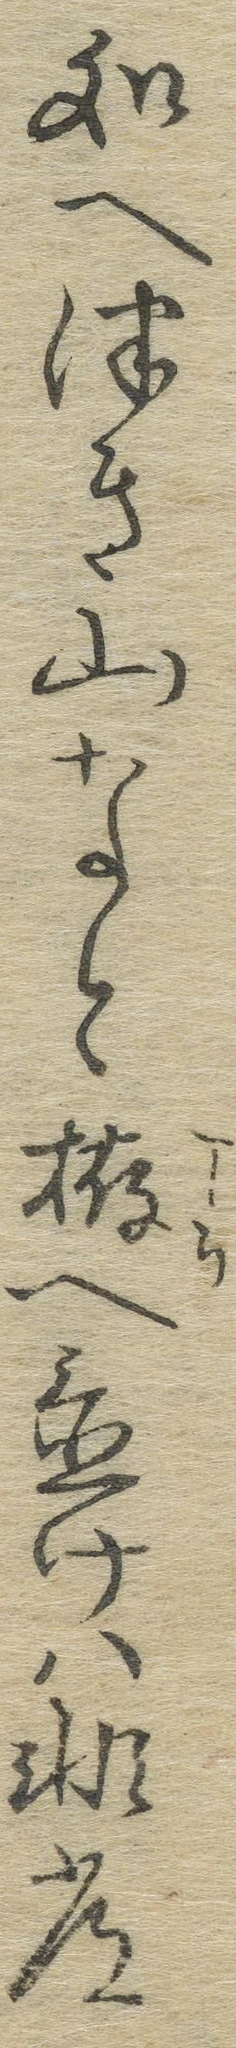処へつき山なと拵へ置けは非道
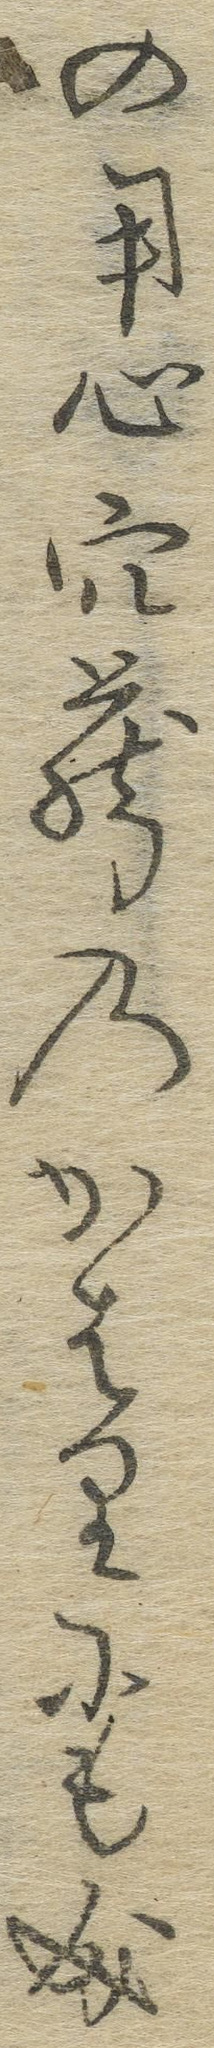の用心穴蔵のかはりにも成
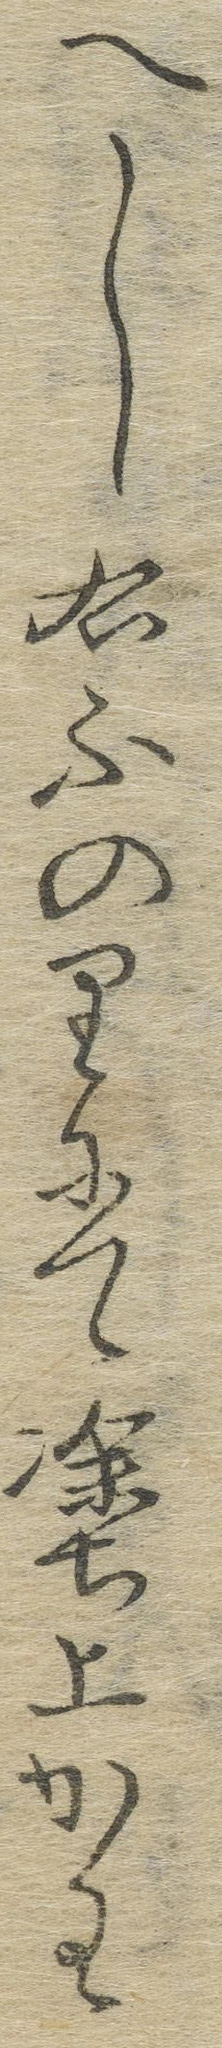へし右ふのりにて塗上かわ
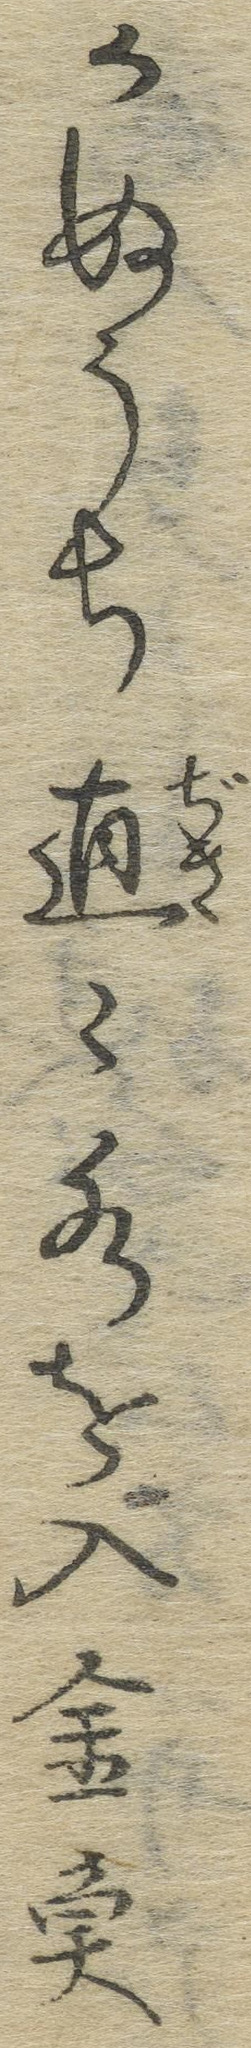かぬうち直々水を入金魚
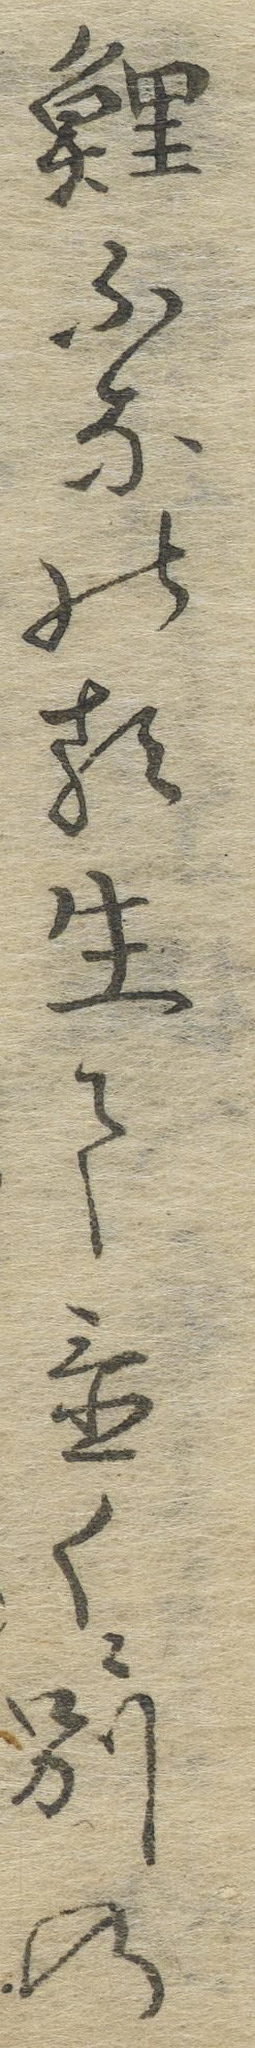鯉ふなの類生て置くに別の
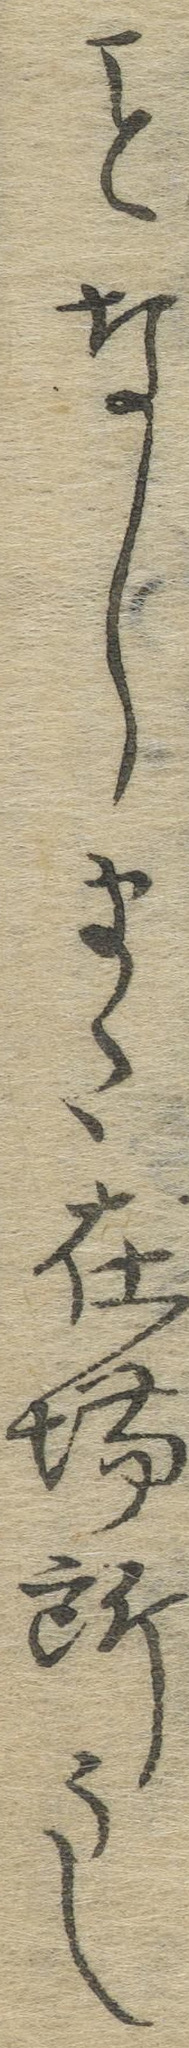ことなしまた在場所うし

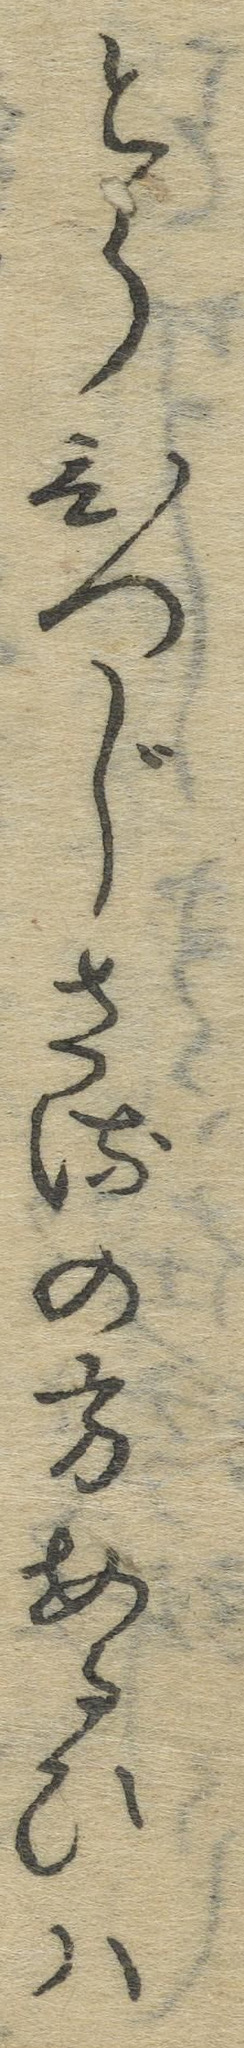とらひつじさるの方あるひは
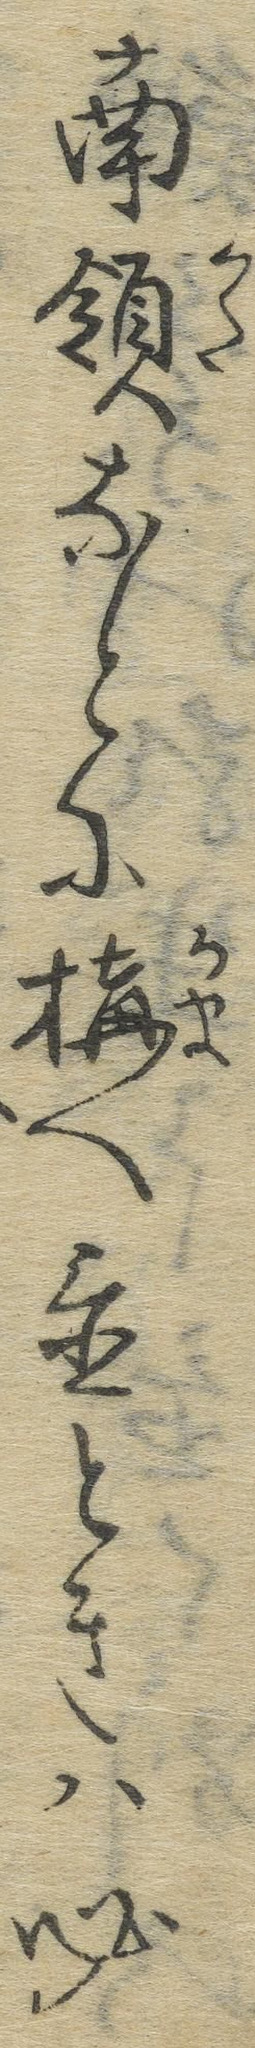南領なとに構へ置ときは必
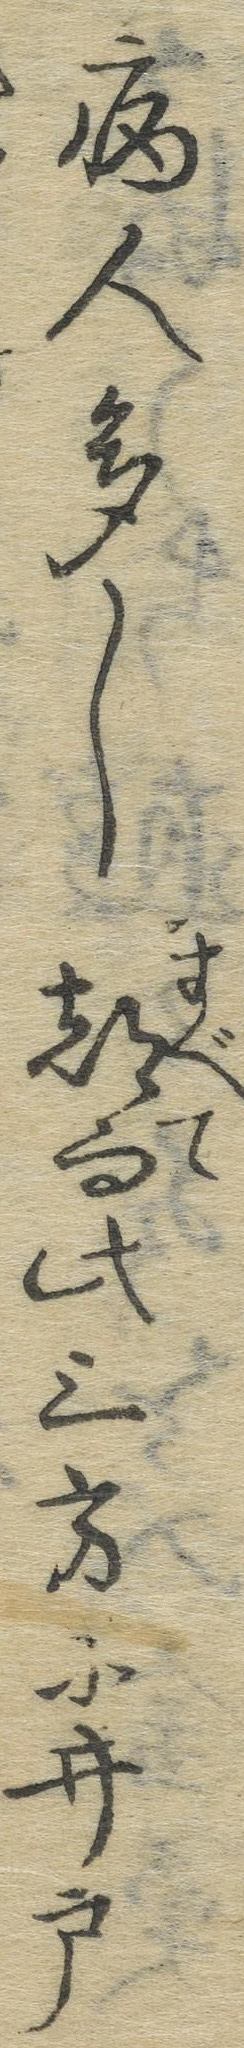病人多し都而此三方に井戸
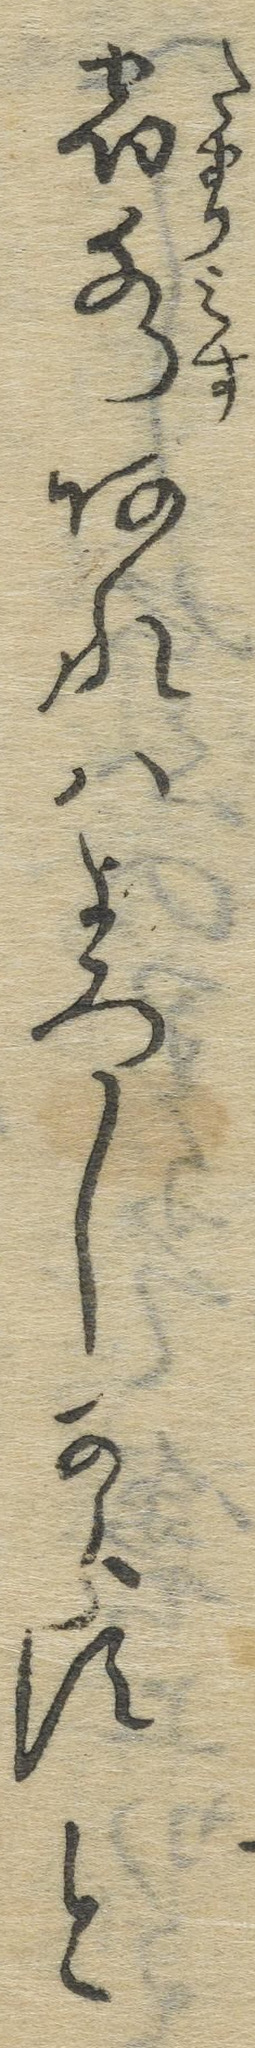宿水あれはよろしからすと
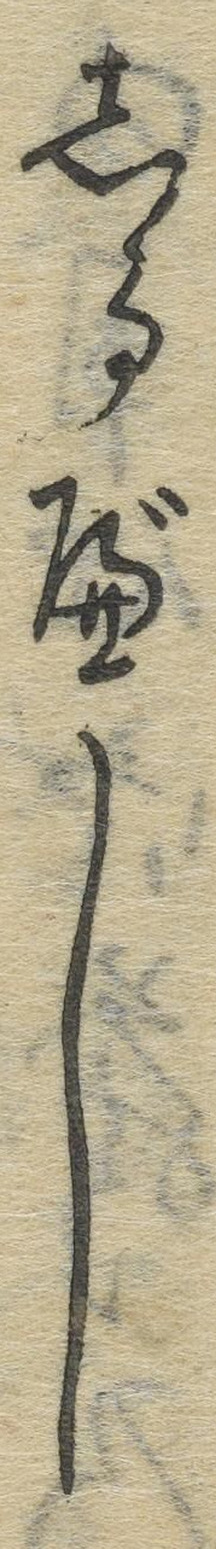しるべし
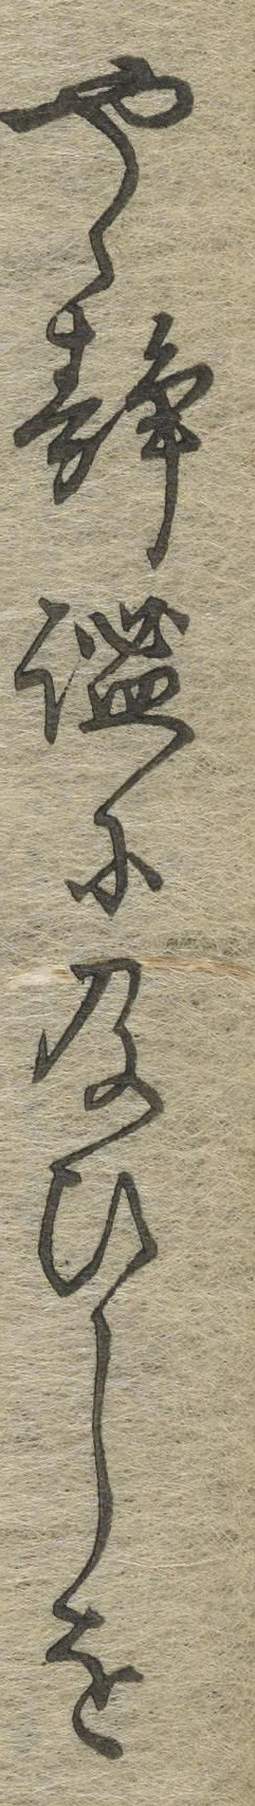やゝ静謐に及ひしを
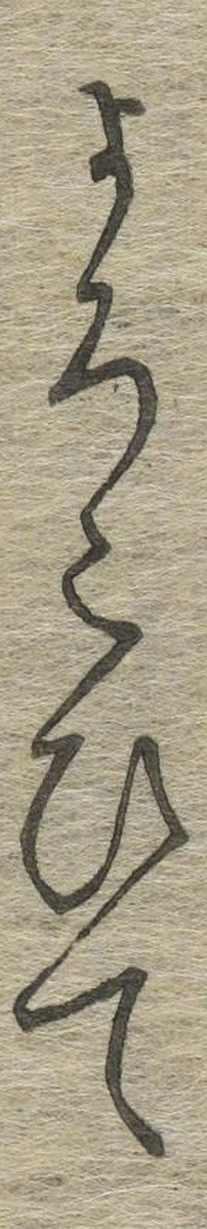よろこひて
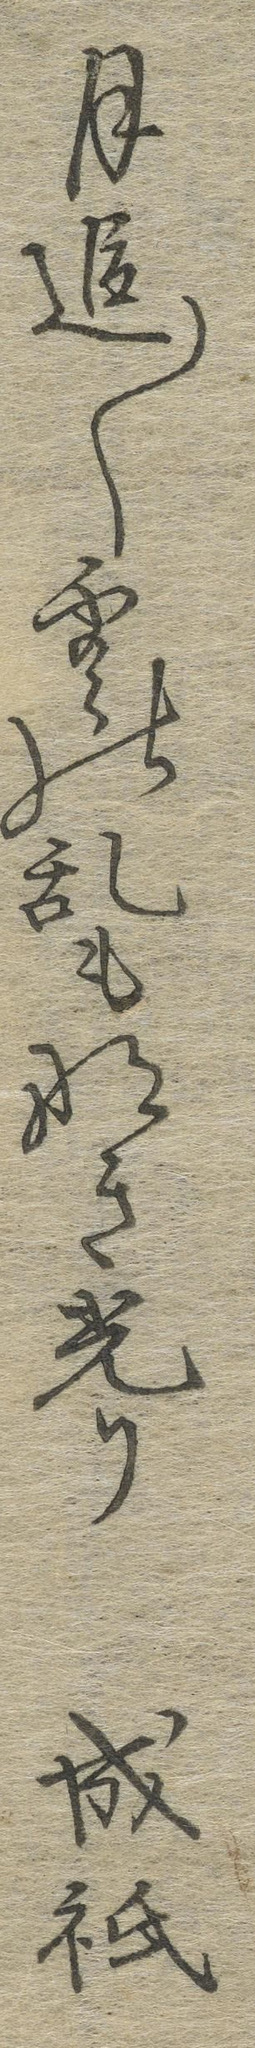月追〳〵雲の乱もなき光り成祇
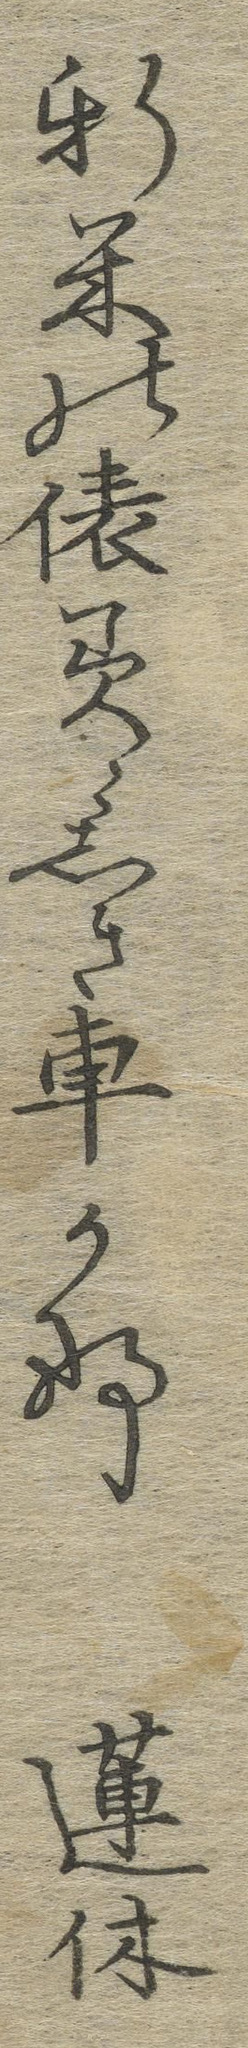新米の俵美〻しき車かな蓮休
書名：あきの日照
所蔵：東京大学地震研究所図書室 Earthquake Research Institute Library, The University of Tokyo, JAPAN
